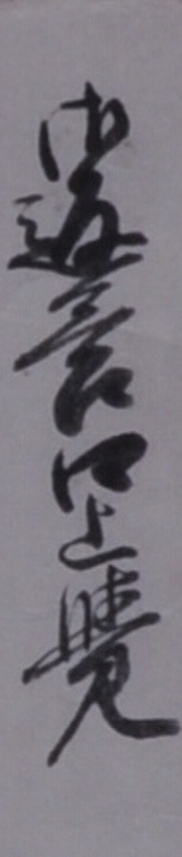御返答口上覚
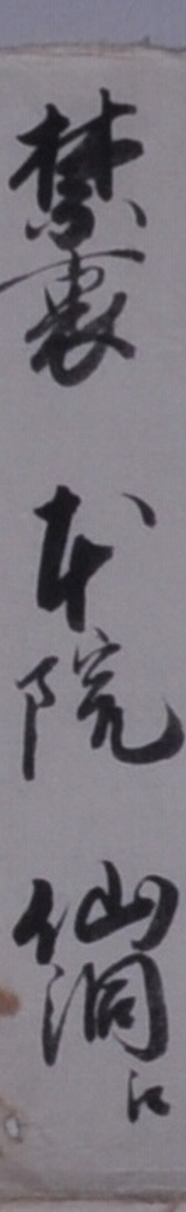禁裏本院仙洞え
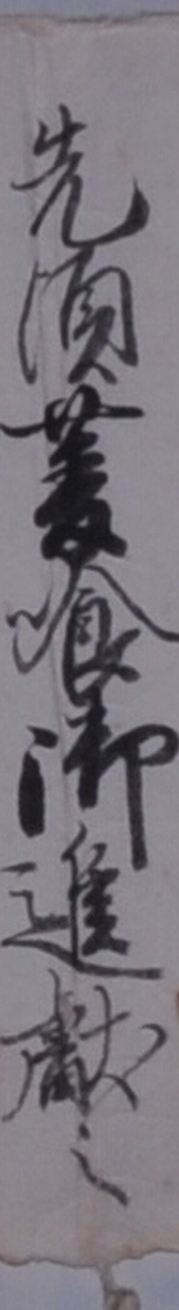先頃菱喰御進献之
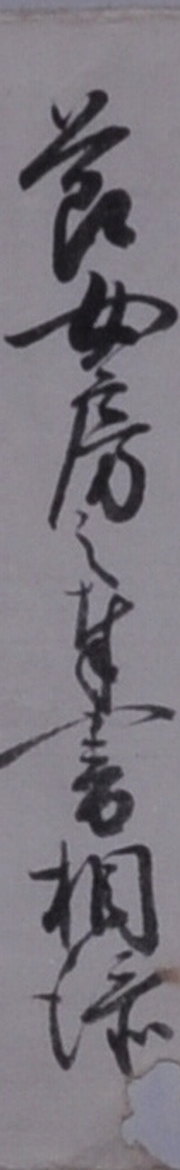節女房之奉書相添
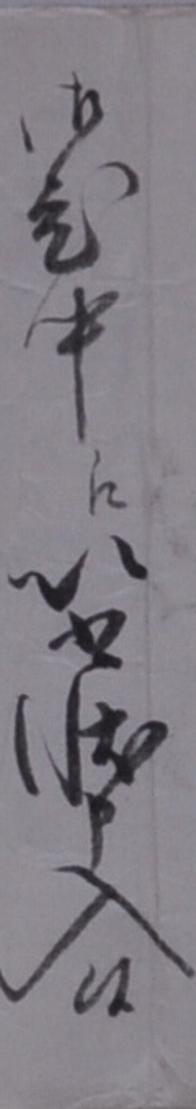御老中え以書状申入候
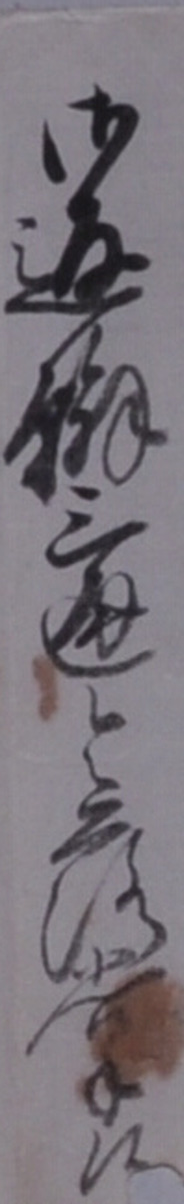御返翰三通令落掌候
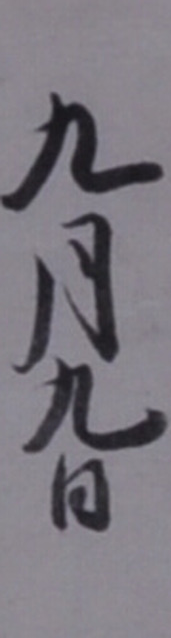九月九日
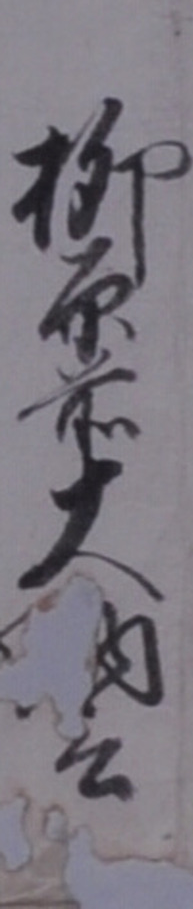柳原前大納言
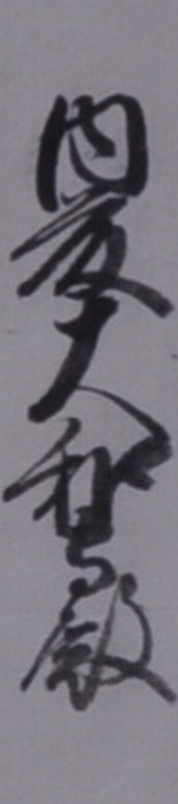内藤大和守殿
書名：御返答口上覚
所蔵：伊那市立高遠町図書館・合同会社AMANE
